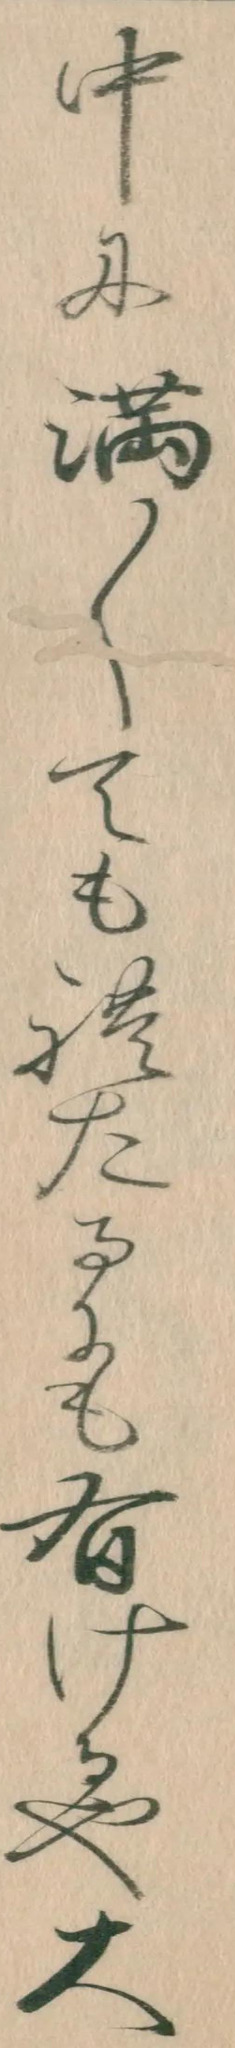中に満〳〵てもれたるにも有けるや大
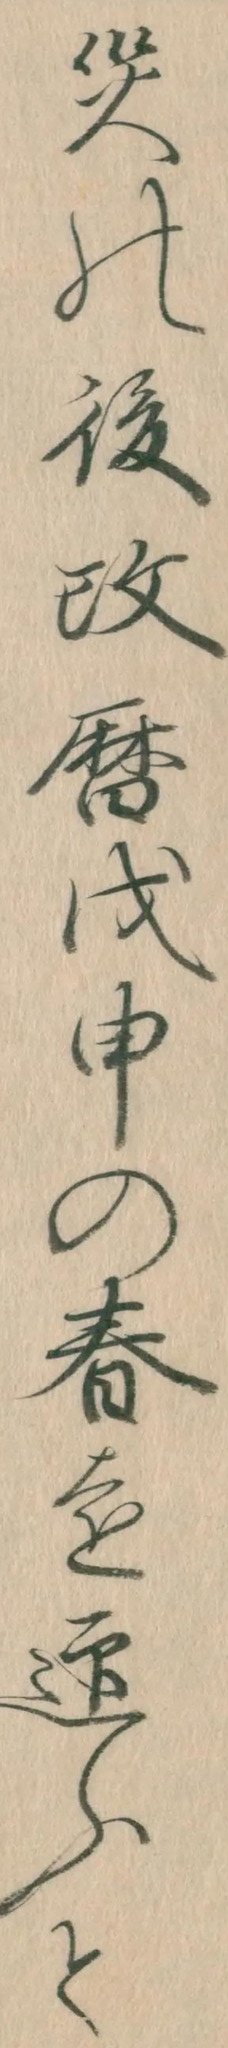災の後改暦戊申の春を迎ふと
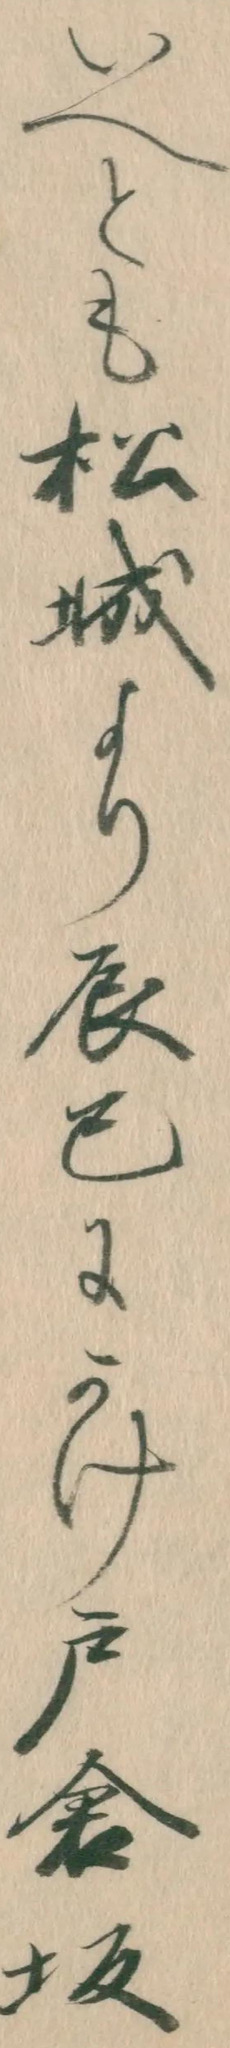いへとも松城より辰巳にかけ戸倉坂
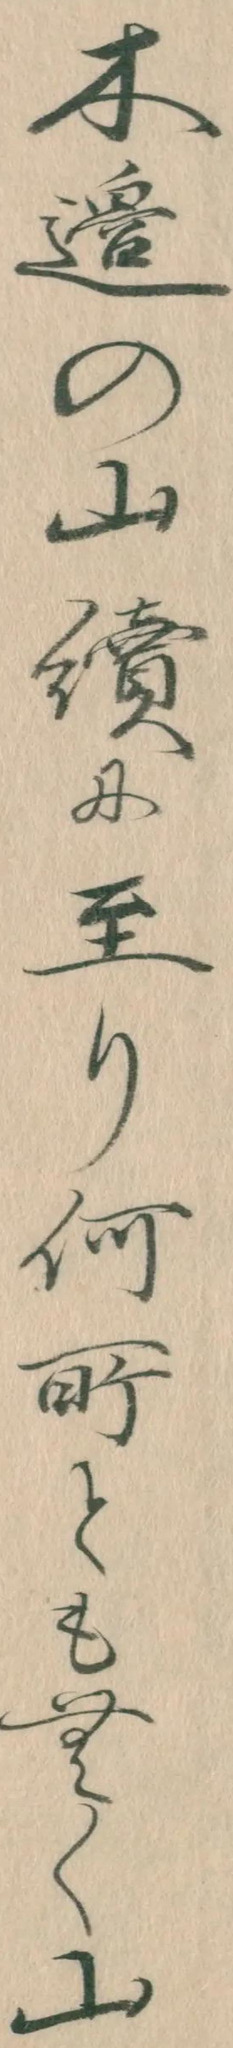木辺の山続に至り何所とも無く山
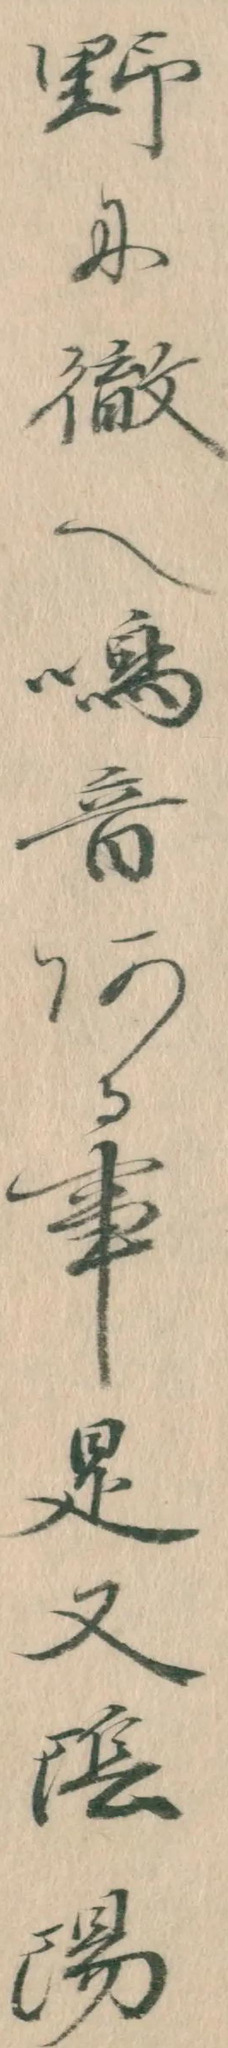野に徹へ鳴音ある事是亦陰陽
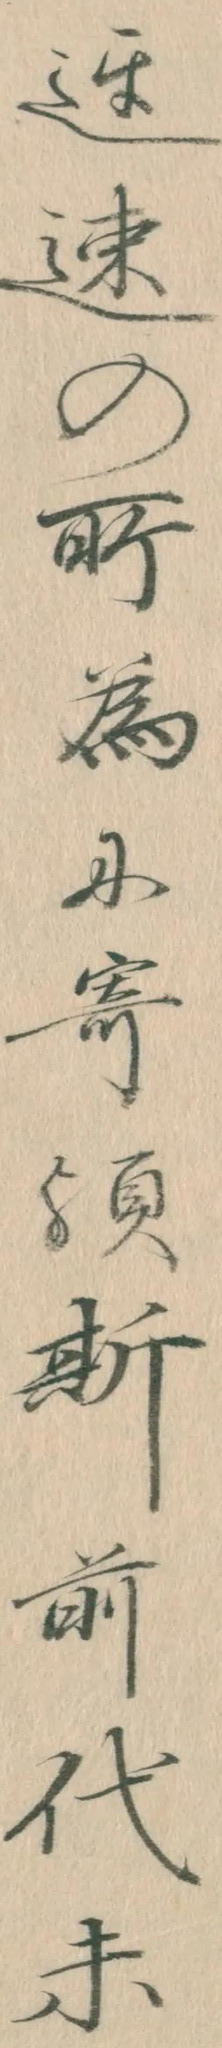遅速の所為に寄る斯前代未
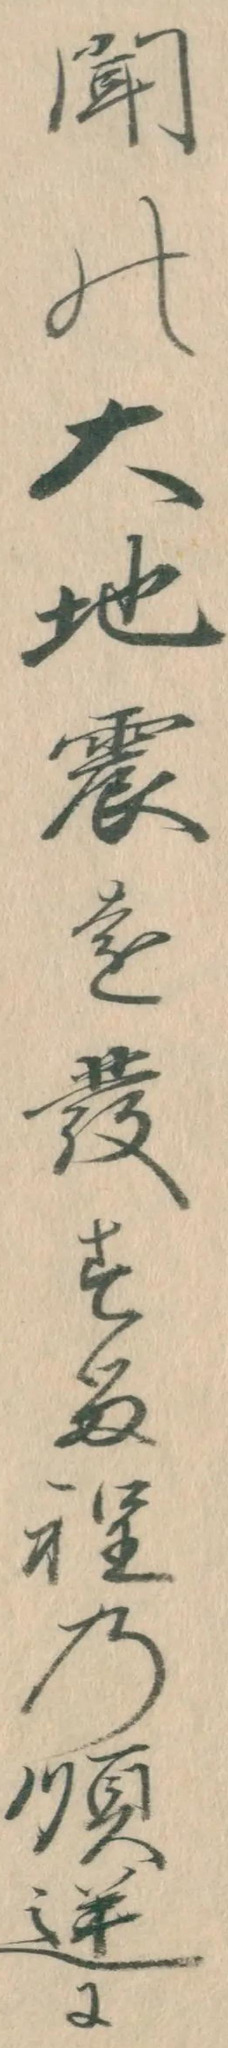聞の大地震を発する程の順逆に

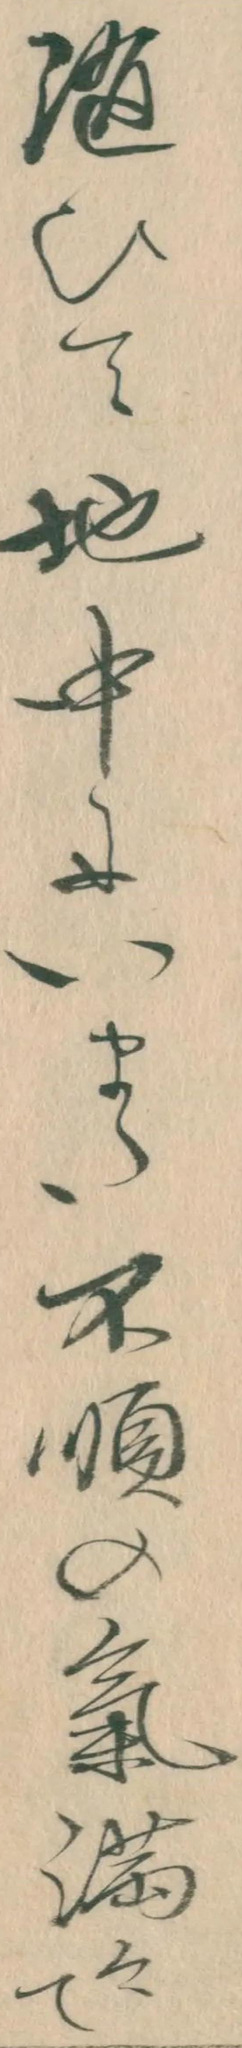随ひて地中にいまた不順の気満々て
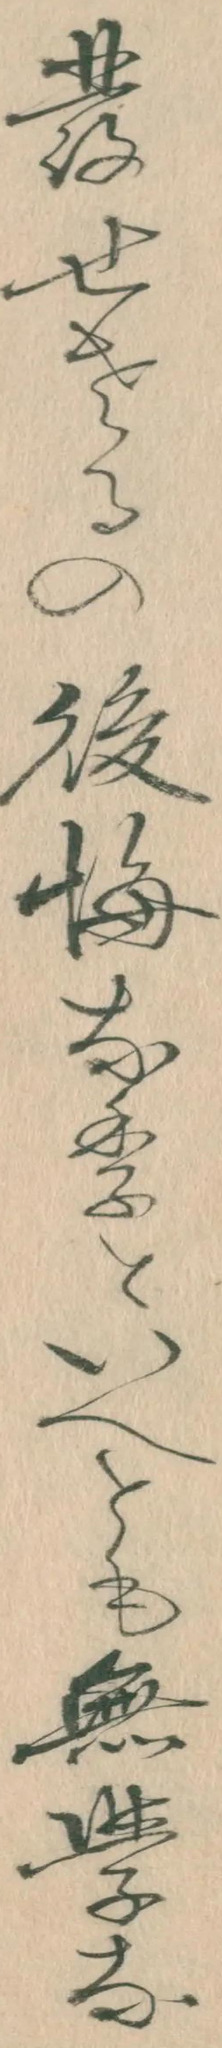発せさるの後悔なりといへとも無学な
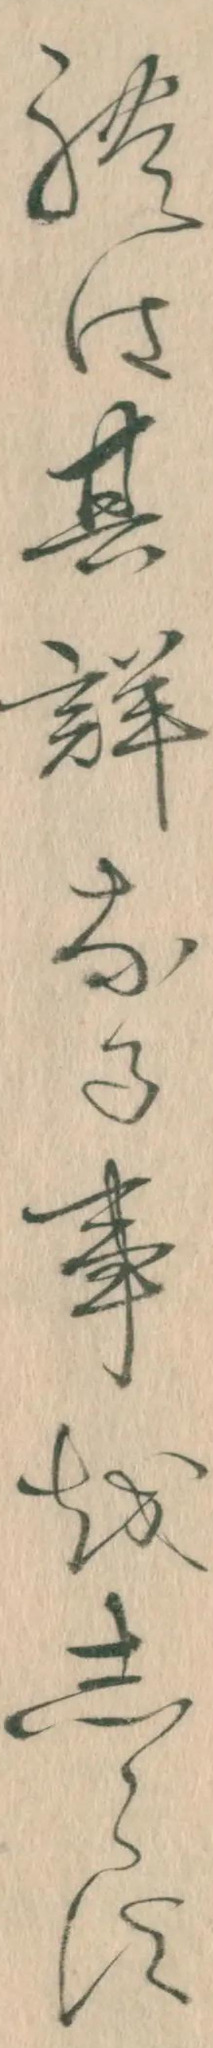れは其詳なる事をしらす
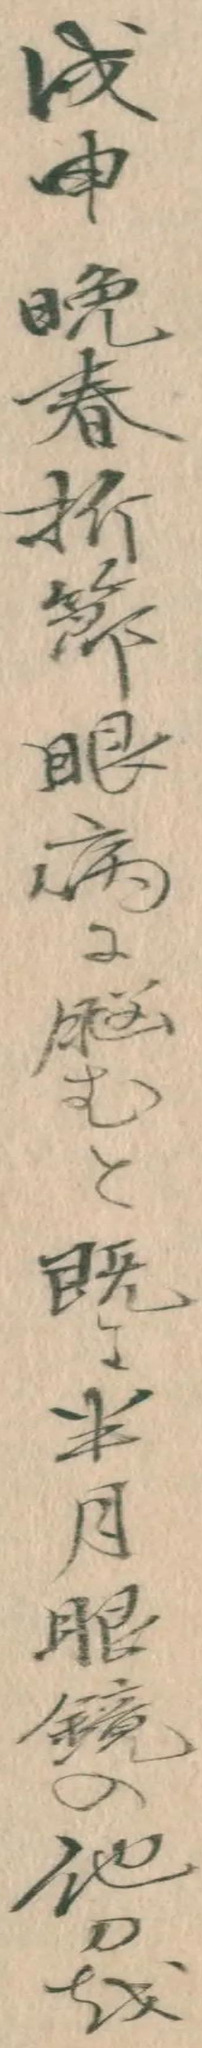戊申晩春折節眼病に脳むと既に半月眼鏡の他力を
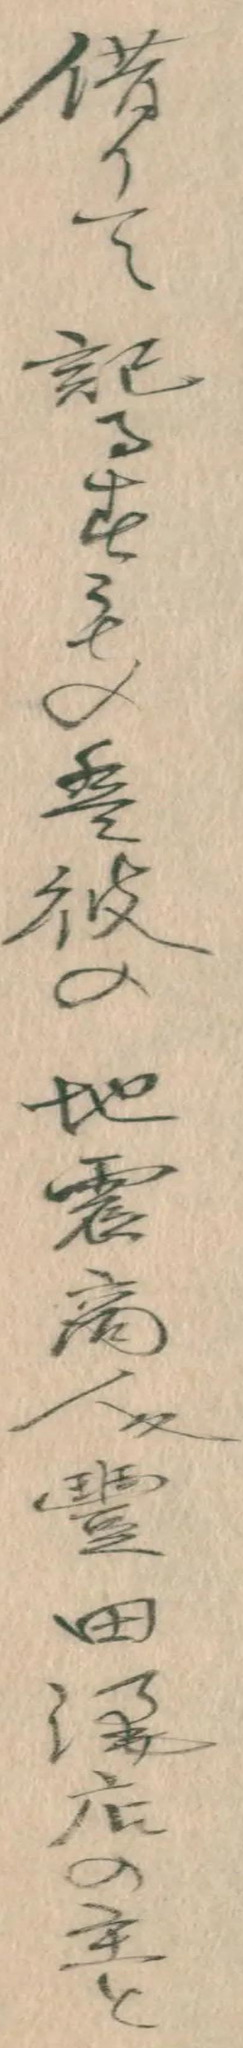借りて記るすものは彼の地震商人豊田店の主と
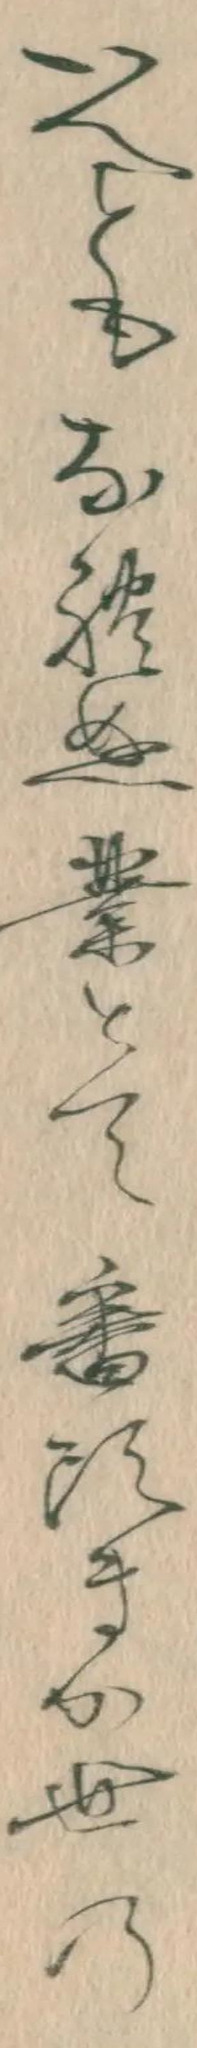いへともなれぬ業とて番頭まかせの
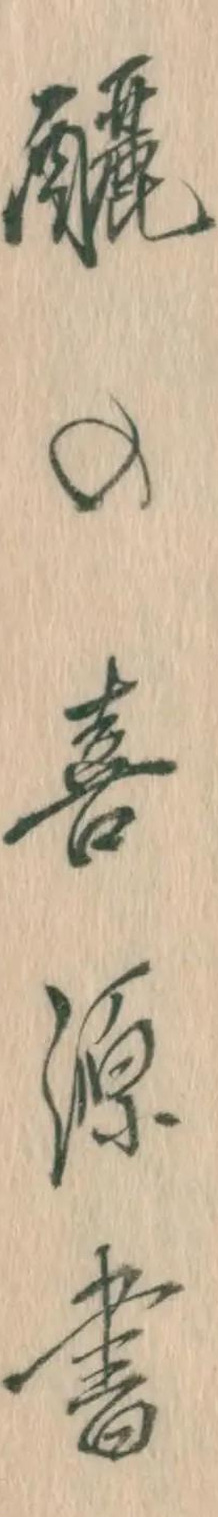釃の喜源書
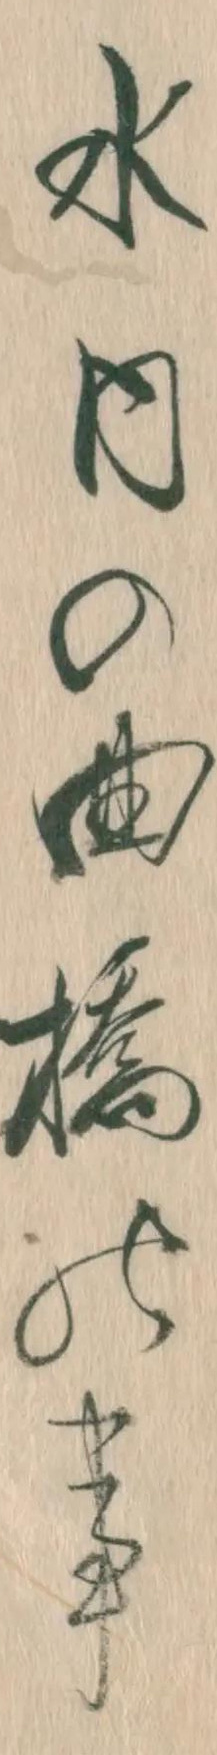水内の曲橋の事
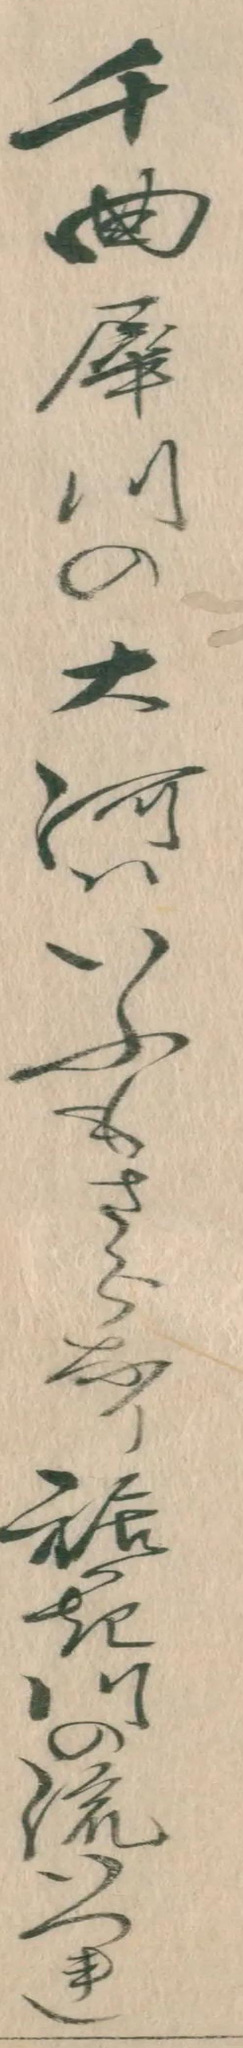千曲犀川の大河はいふもさらなり裾花川の流いつれ
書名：俗語之種. [6]
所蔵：国立国会図書館 National Diet Library, JAPAN
